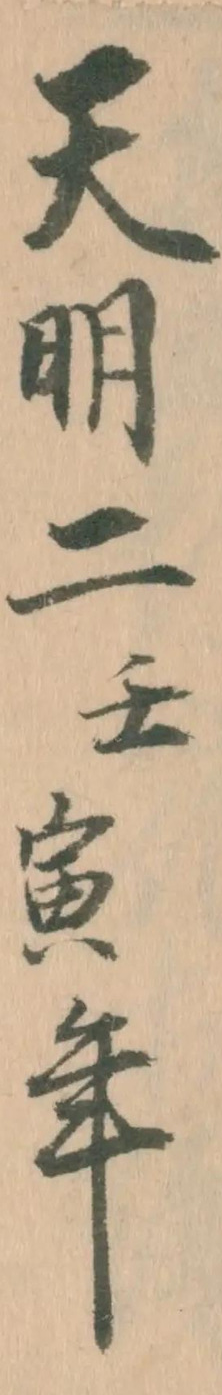天明二壬寅年
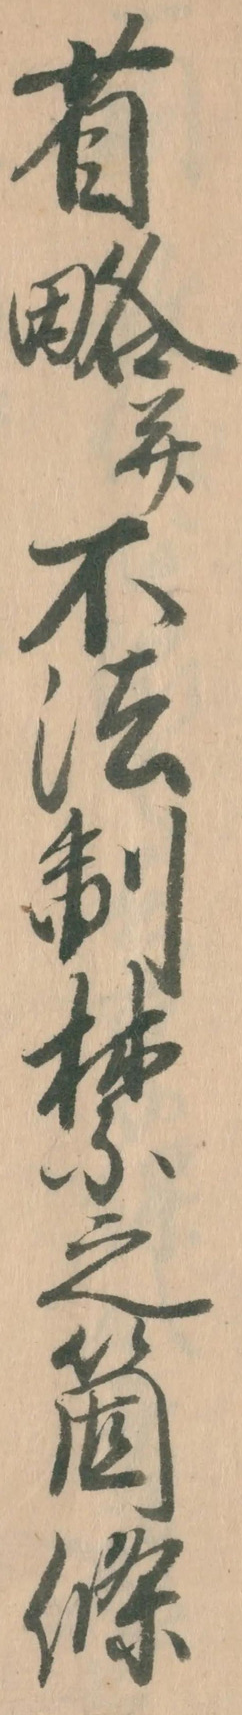省略幷不法制禁之箇条
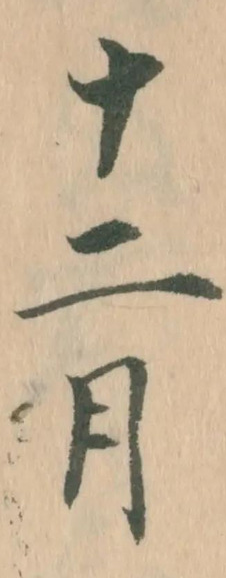十二月

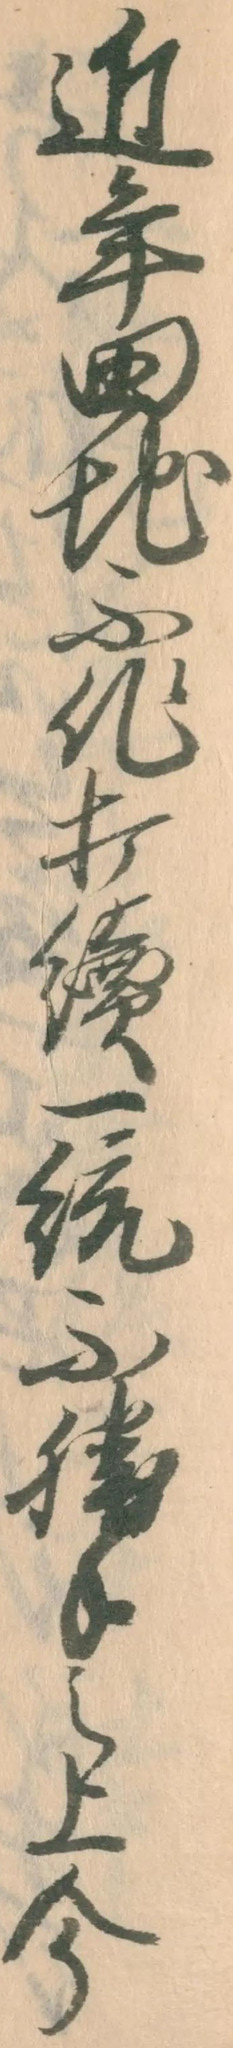一近年田地不作打続一統不勝手之上今
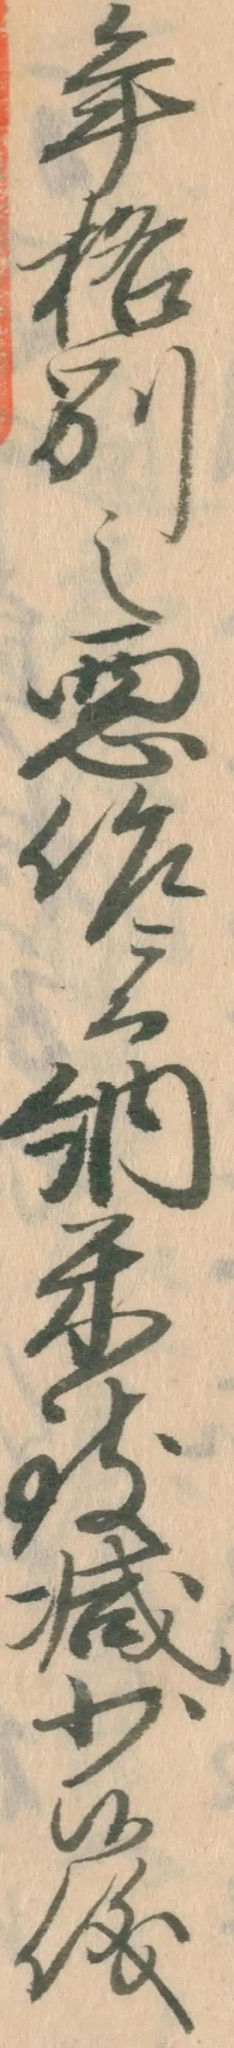年格別之悪作ニ而納米致減少候儀
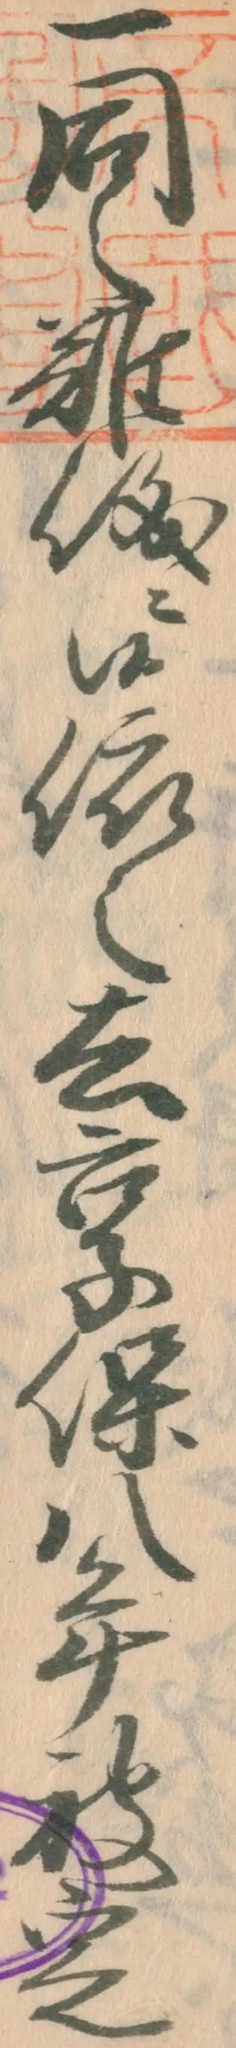一同之難儀ニ候依之去享保八年被定
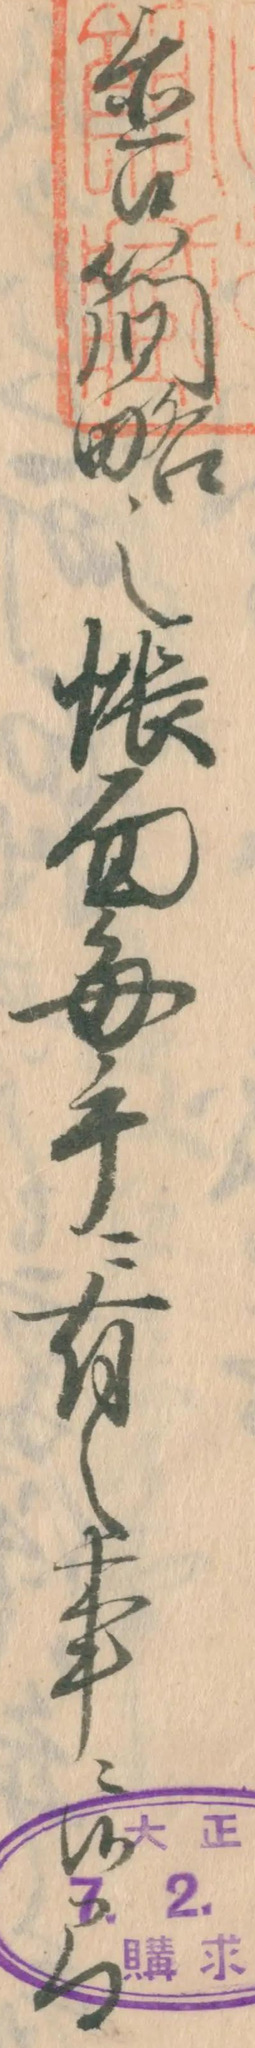置候簡略之帳面毎手ニ有之事ニ候間
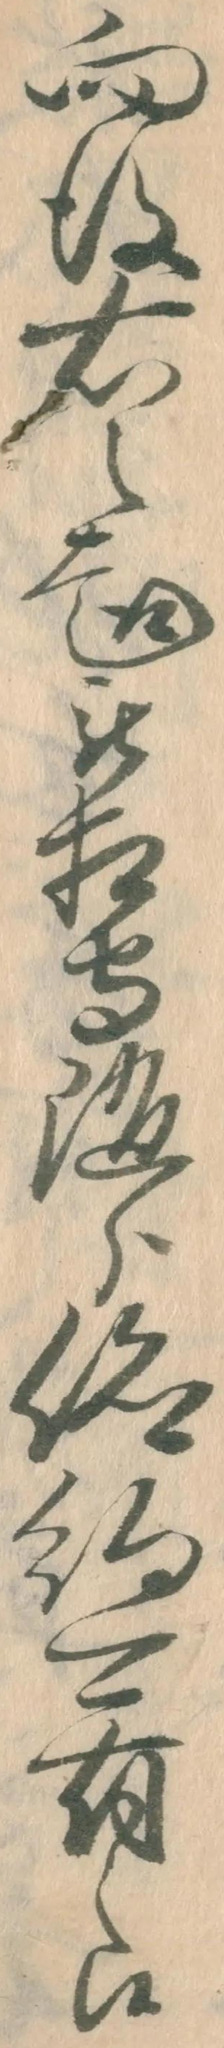向後右之趣被相守随分倹約可有之候
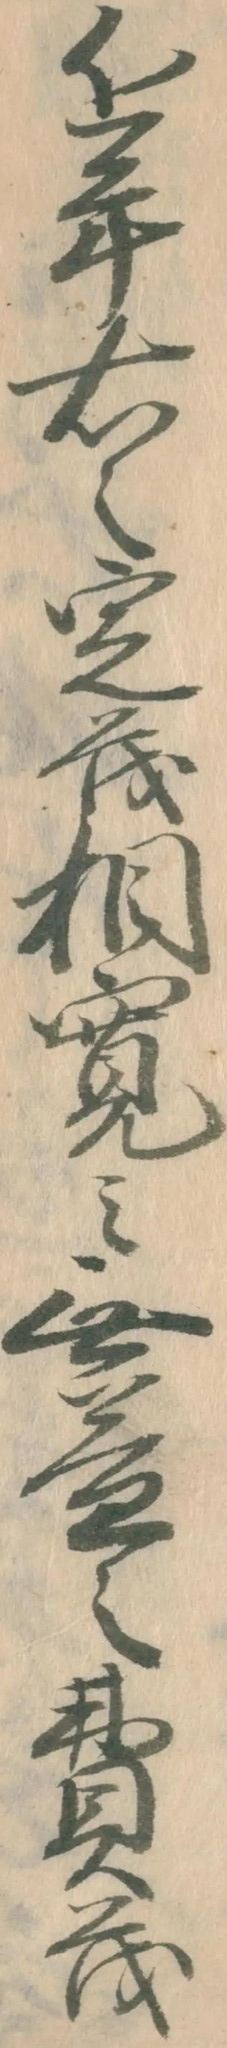近年右之定茂相寛ミ無益之費茂
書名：賀茂社記録. 第37冊
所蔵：国立国会図書館 National Diet Library, JAPAN
